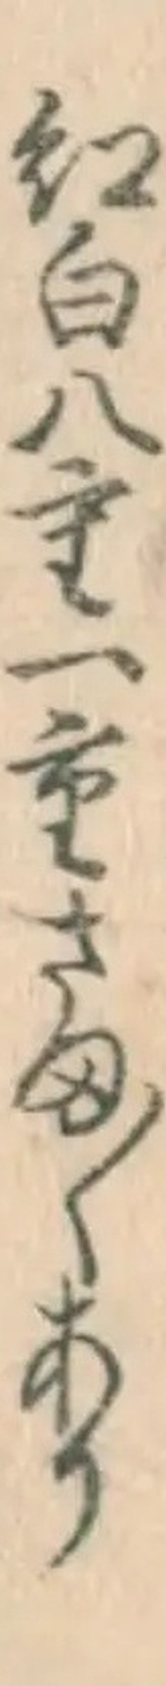紅白八重一重さまざまあり
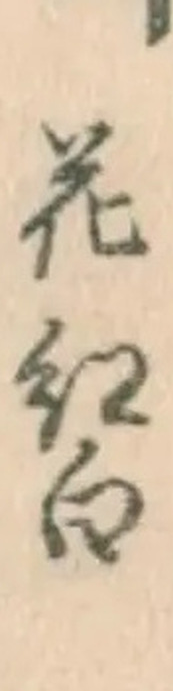花紅白
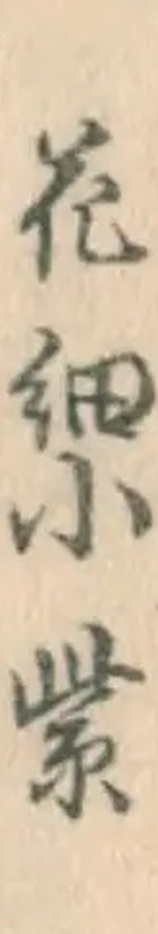花細小紫
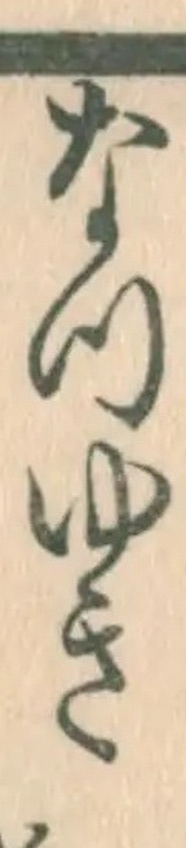なつゆき
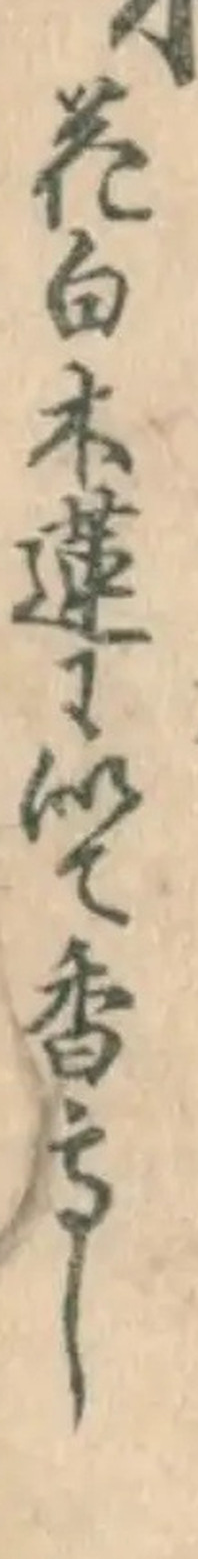花白木蓮に似て香よし

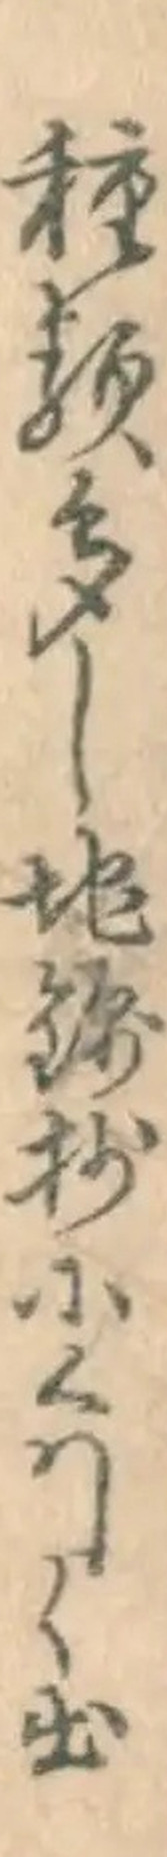芍薬種類多し地錦抄くハしく出
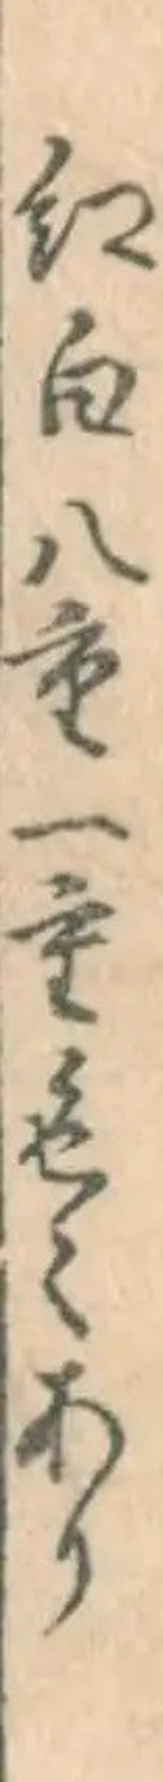紅白八重一重色々あり
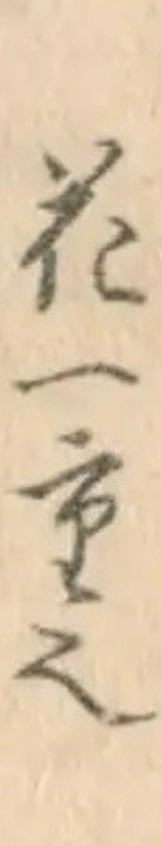花一重也
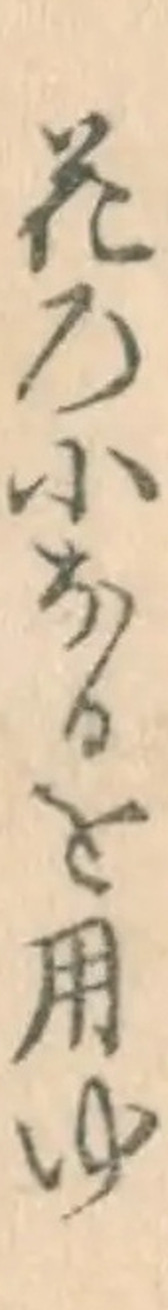花の小なるを用ゆ
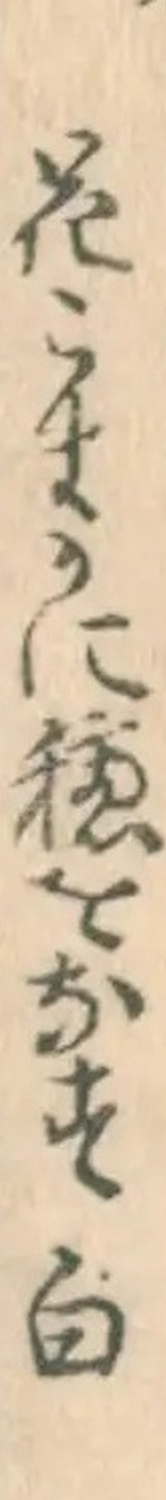花こまかに種おほき白
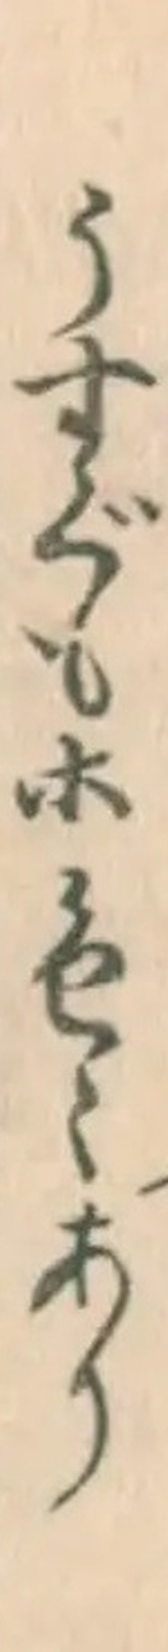うすぐも色々あり
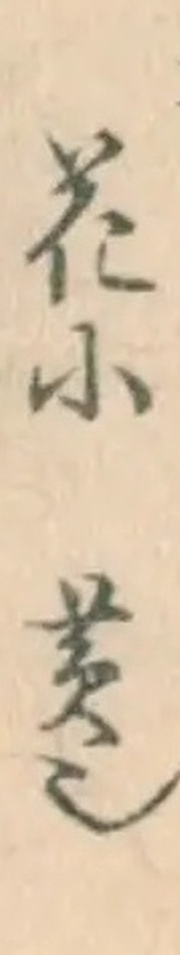花小黄也
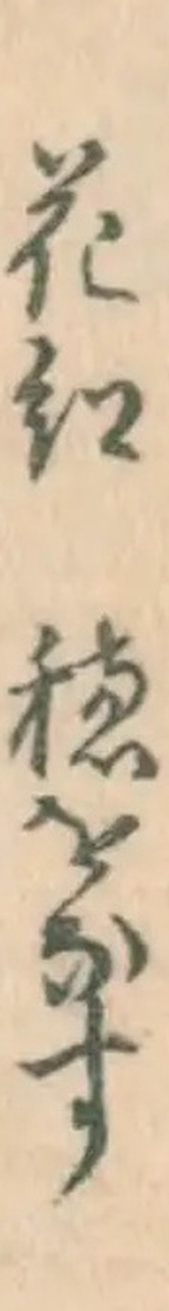花紅穂をなす
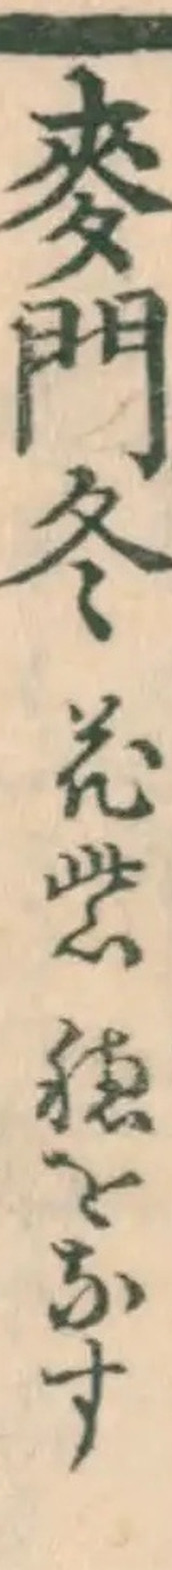麥門冬花紫穂をなす
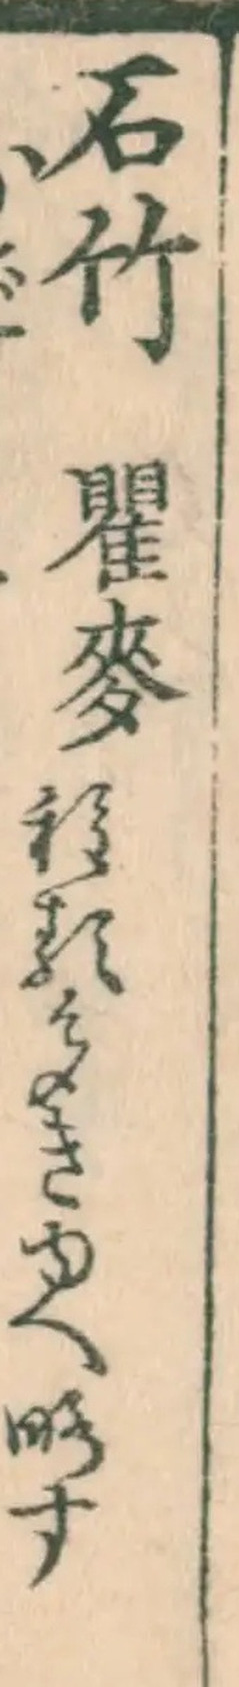石竹瞿麥種類多きゆへ略す
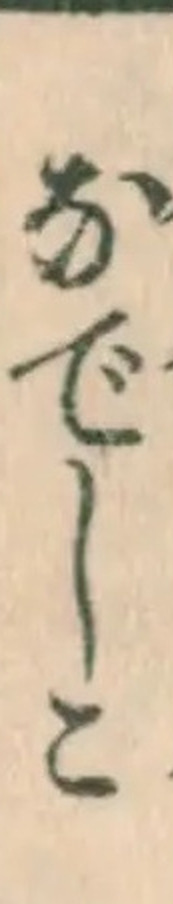なでしこ
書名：茶席挿花集
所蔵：国立国会図書館 National Diet Library, JAPAN
